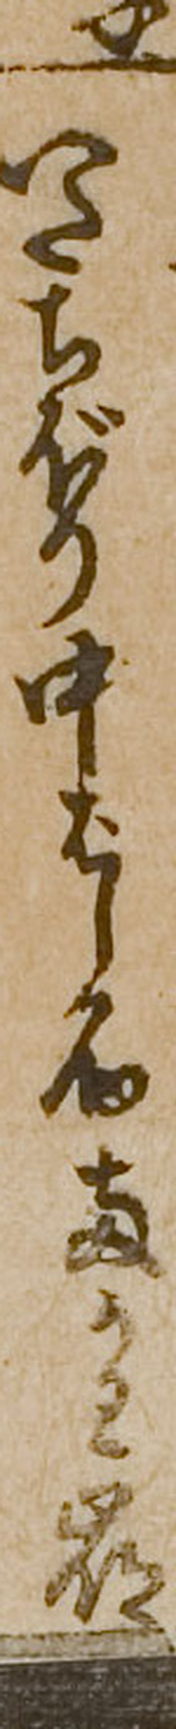いたちぼり中はし宿両かわ崩
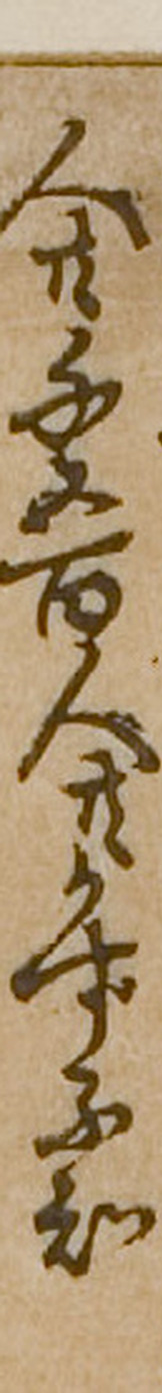人共千五百人共かず不知
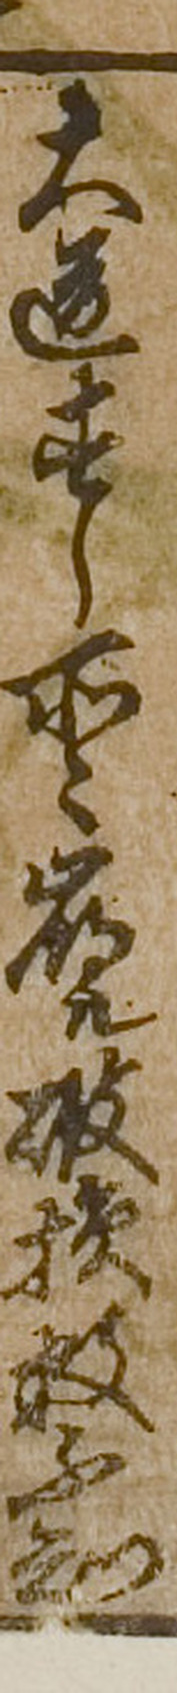大道すし所々崩ル破損数不知
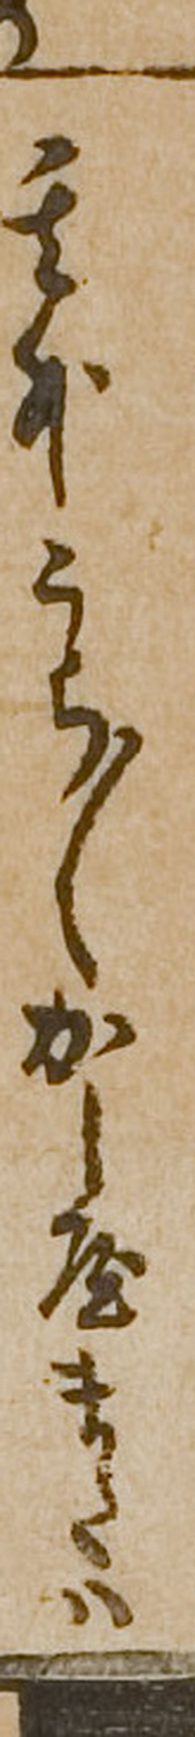其外うら〳〵かし屋またハ
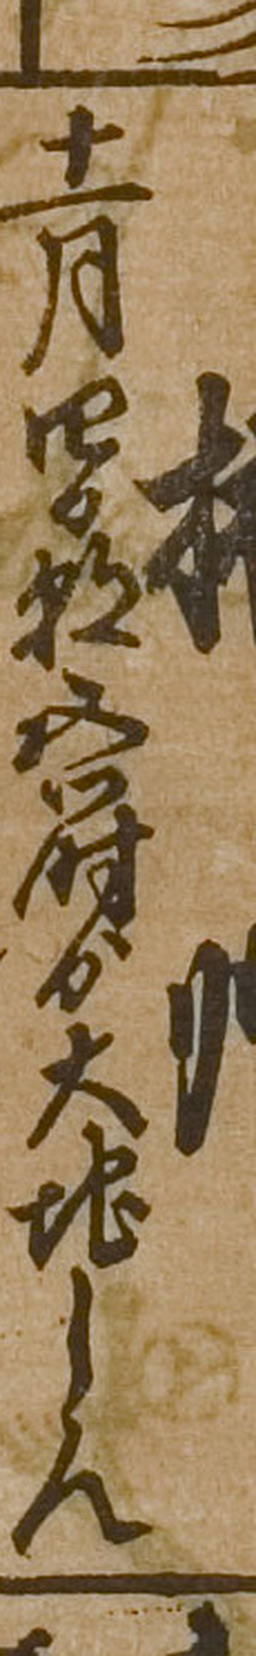十一月四日朝五ツ時ゟ大地しん
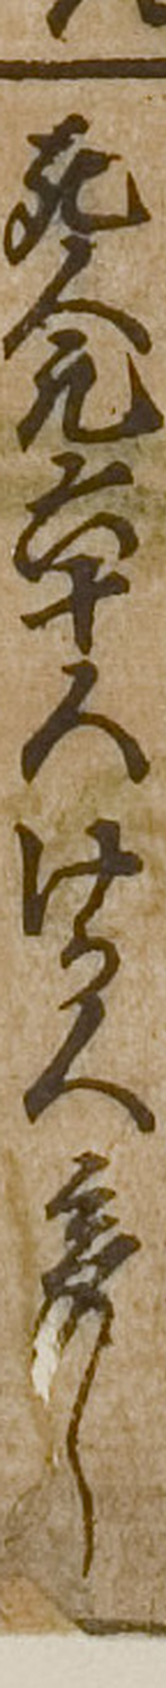死人凡六十人けか人多し
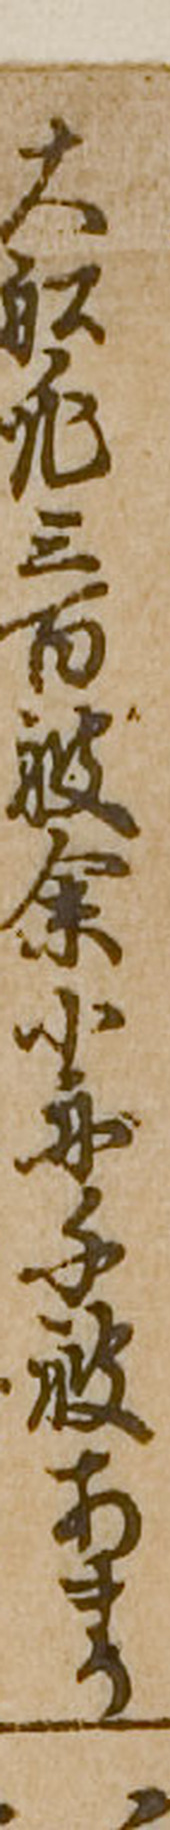大船凡三百艘余小舟千艘あまり
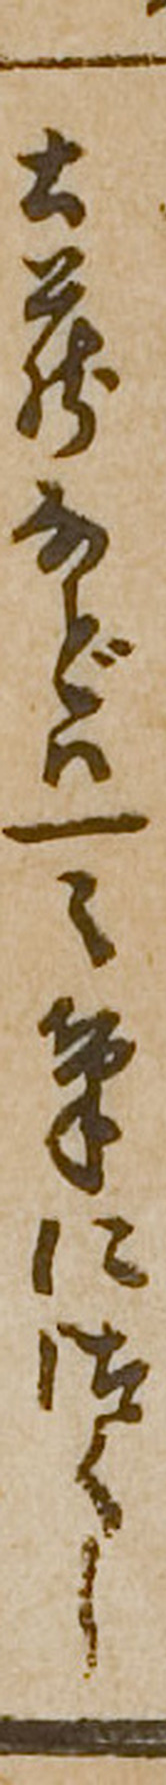土蔵などハ一々筆につくし
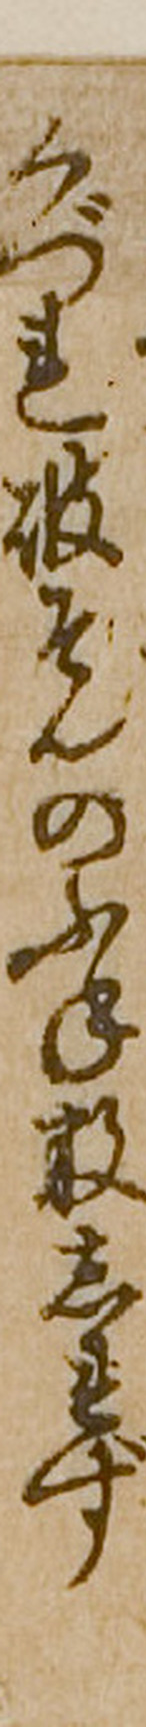くづれ破そんのふね数しれず
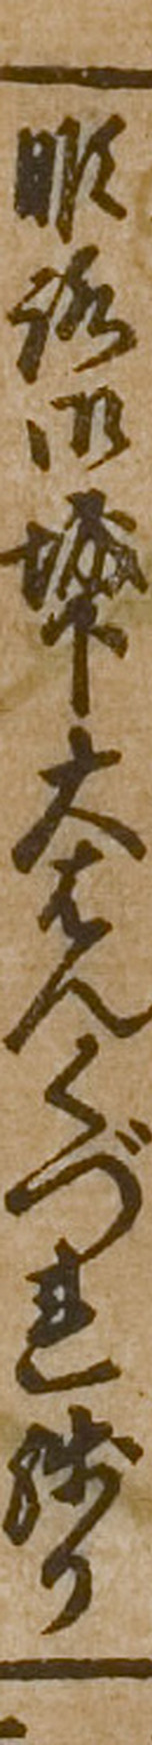姫路御城下大はんくづれ残り
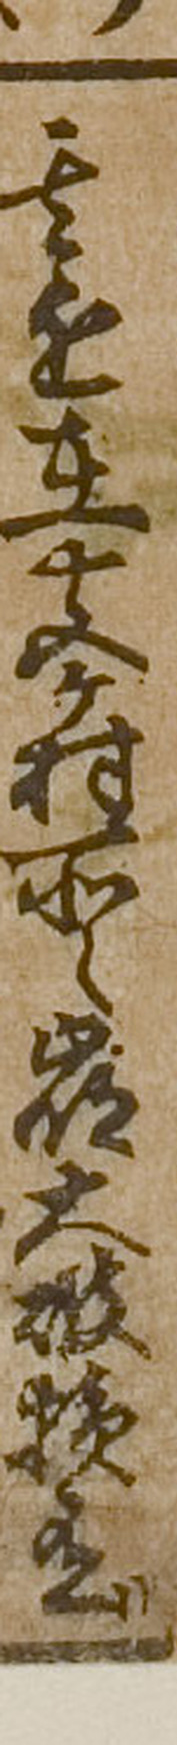其近在十五ヶ村所々崩大破損有
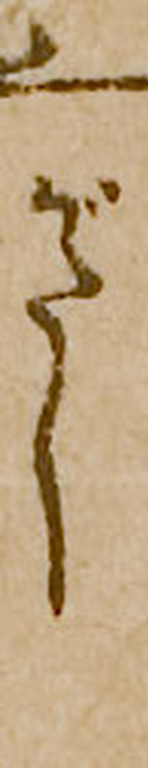がたし
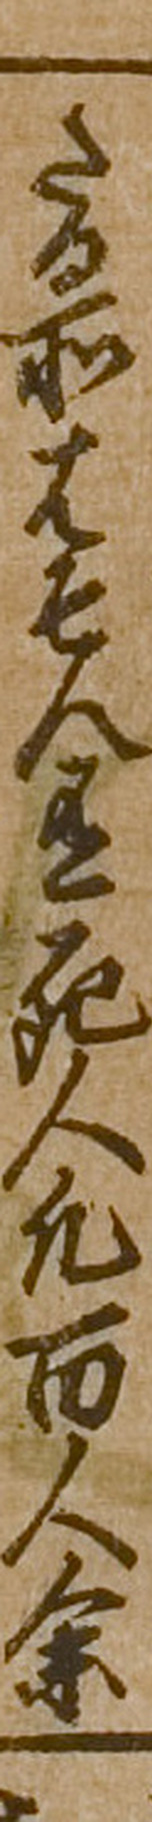たる所はそん有死人凡百人余
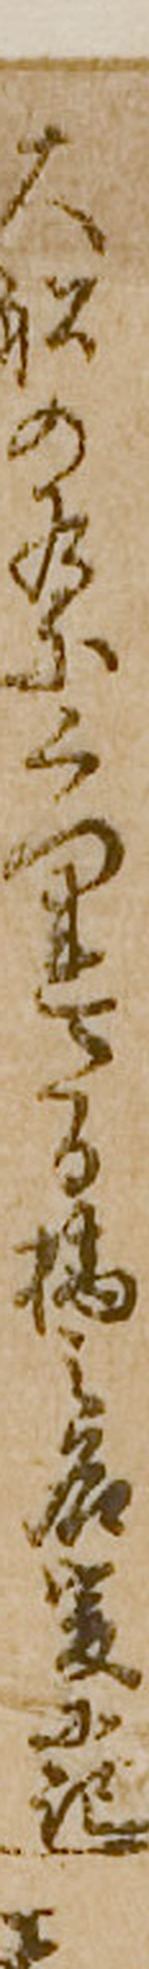大船の為にくつれたる橋の名爰に記
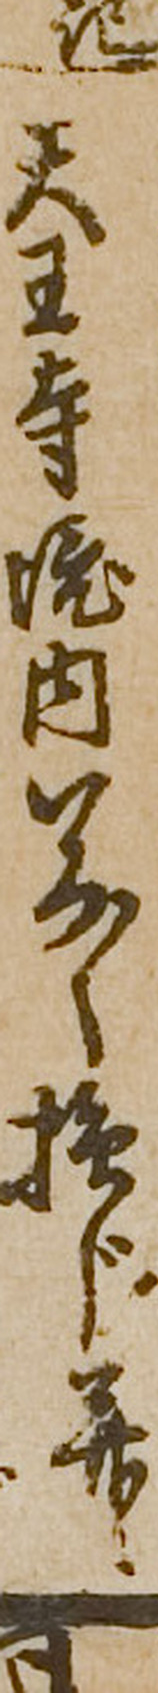天王寺境内いろ〳〵損じ并ニ
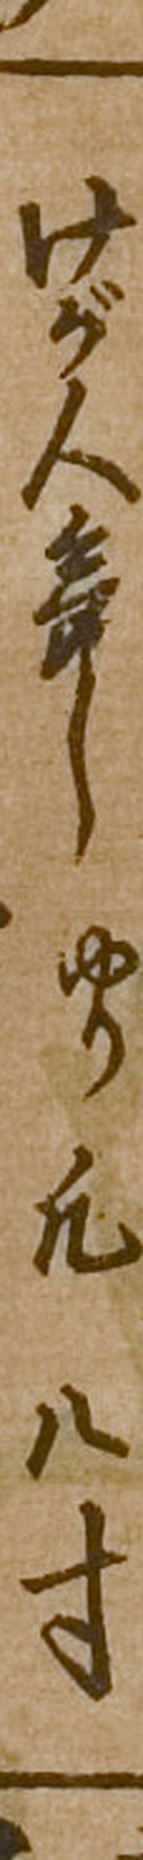けが人多しゆり凡八寸
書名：[大坂つなみ]
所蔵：東京大学総合図書館 General Library in the University of Tokyo, JAPAN
